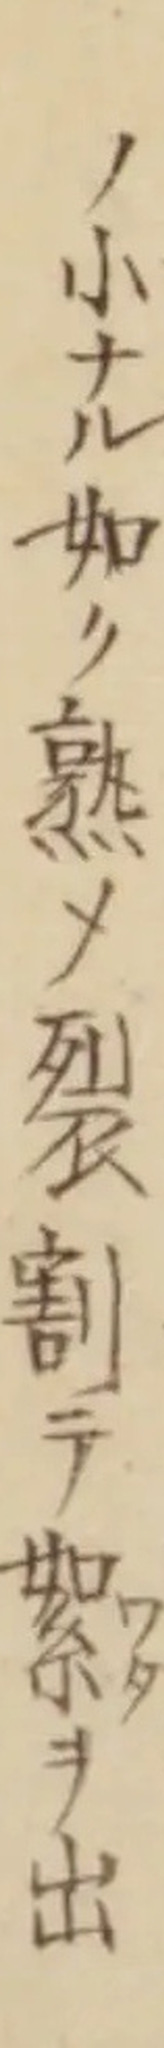ノ小ナル如ク熟メ裂割テ絮ヲ出

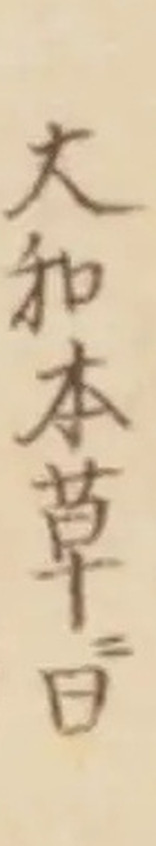大和本草ニ曰
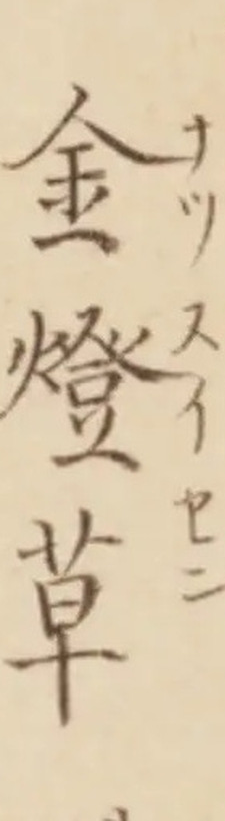金燈草
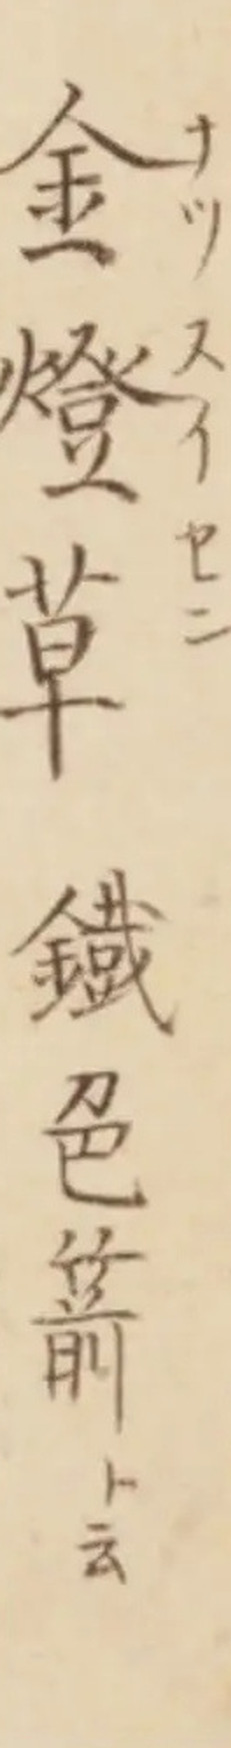金燈草鐡色箭ト云
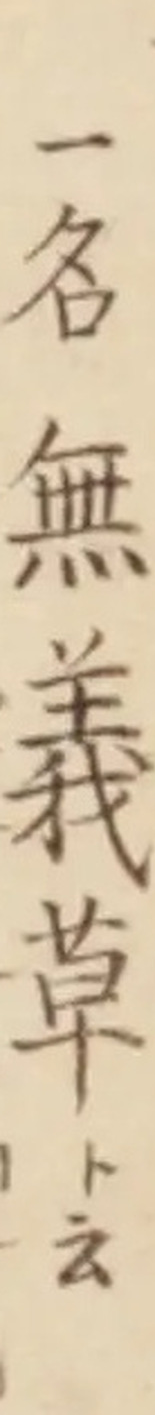一名無義草ト云
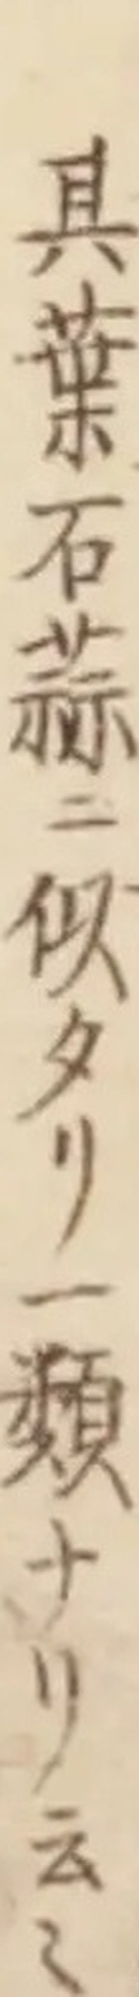其葉石蒜ニ似タリ一類ナリ云々
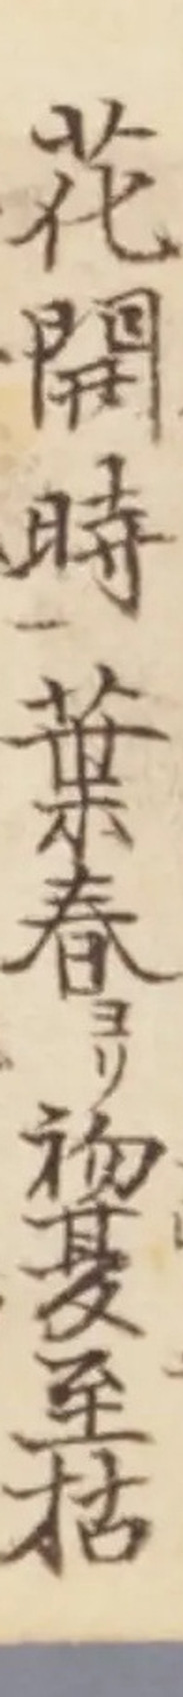花開時葉春ヨリ初夏至枯
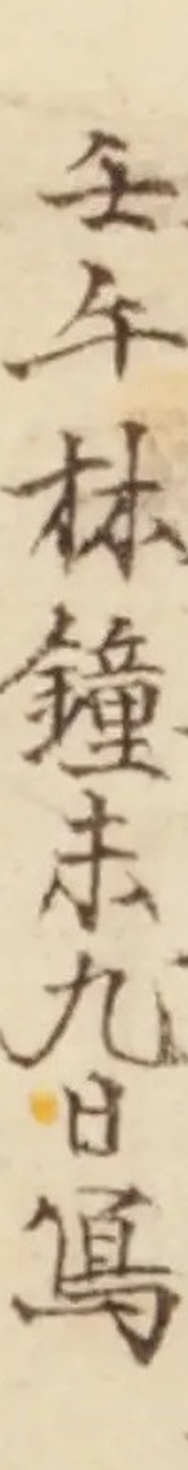壬午林鐘未九日寫
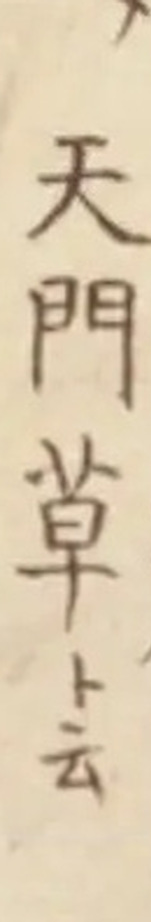天門草ト云
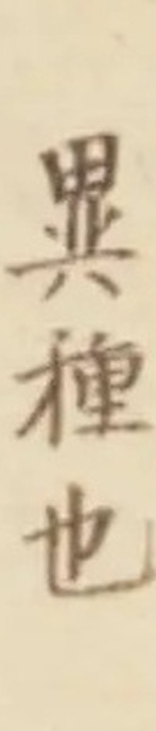異種也
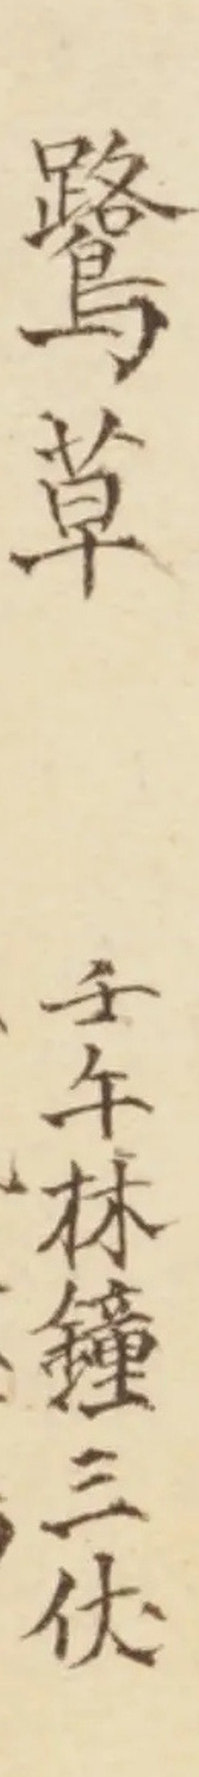鷺草壬午林鐘三伏
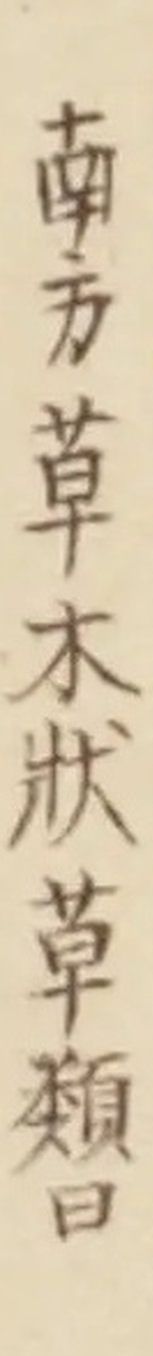南方草木状草類曰
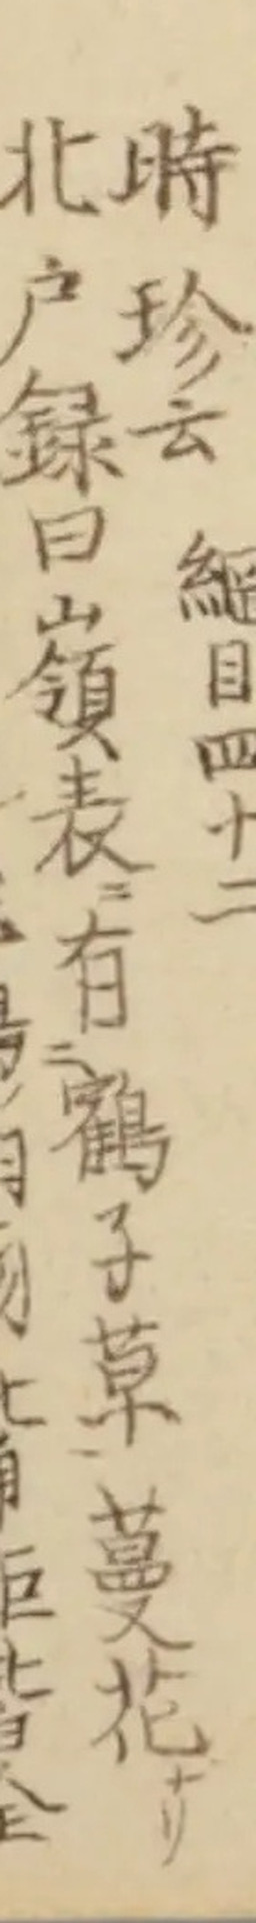北戸録曰山嶺表ニ有鶴子草蔓花ナリ
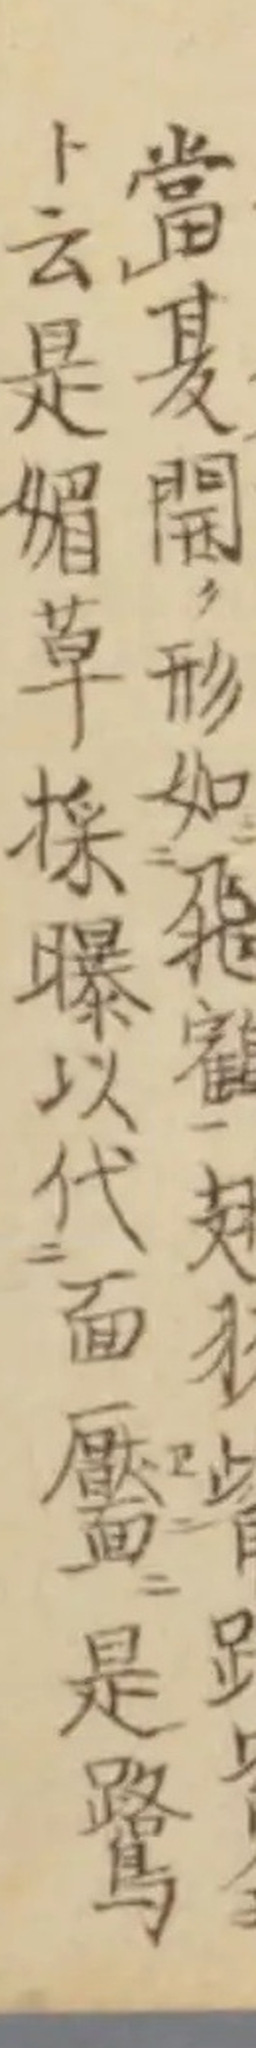ト云是媚草採獏曝以代靨ニ是鷺
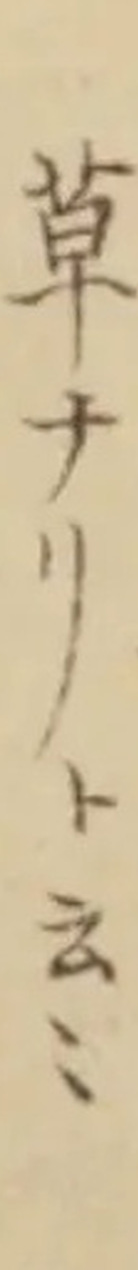草ナリト云々

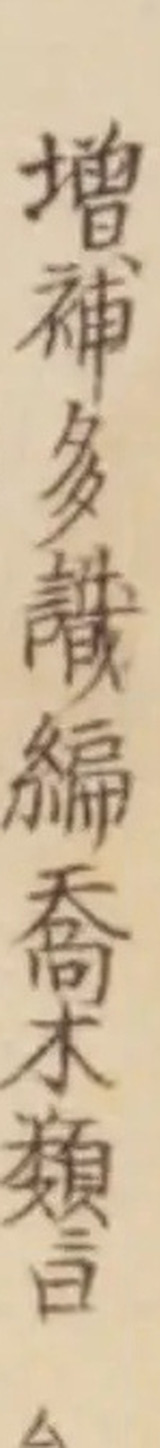増補多識編喬木類ニ曰
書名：梅園草木花譜夏之部. 2
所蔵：国立国会図書館 National Diet Library, JAPAN
